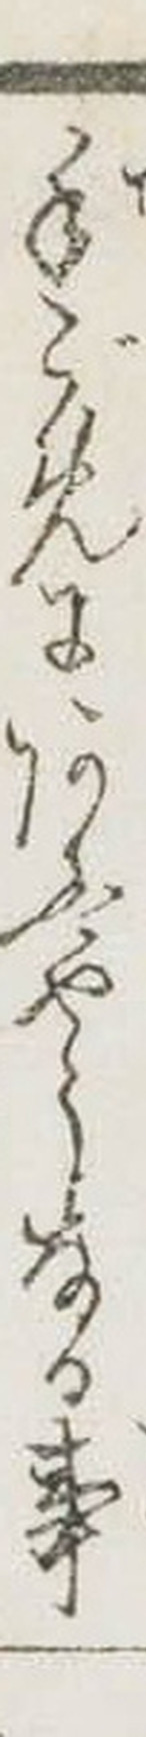手ごめにあふやうなる事
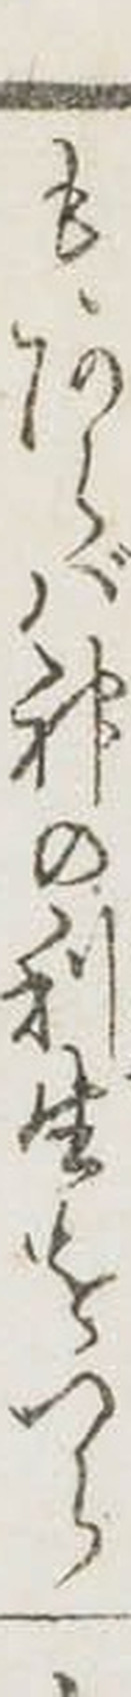もあらば神の利生をつら
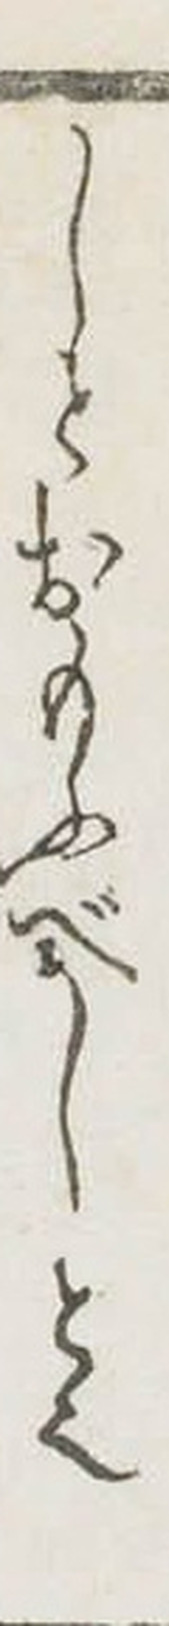しとおもふべしと也
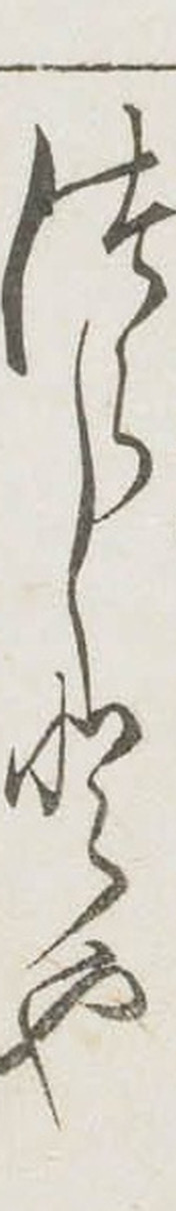つらしとや
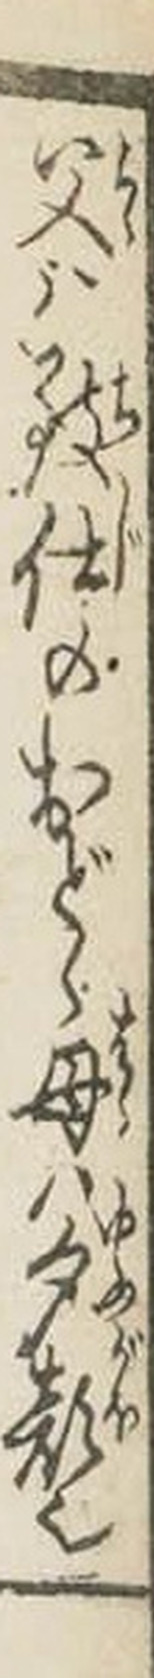父は致仕のおどゝ母は夕顔也
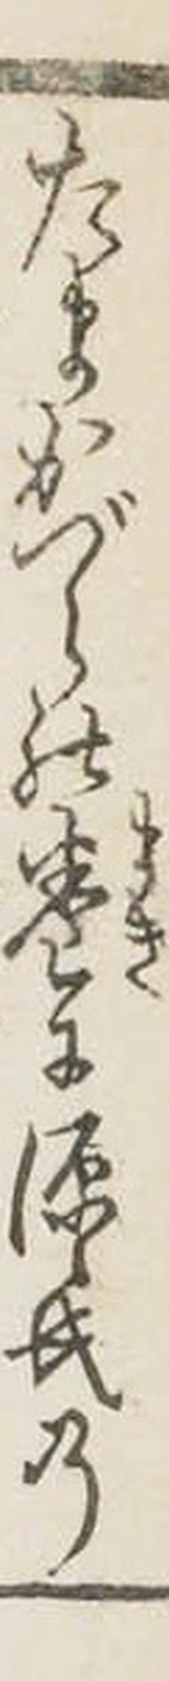たまかづらの巻に源氏の
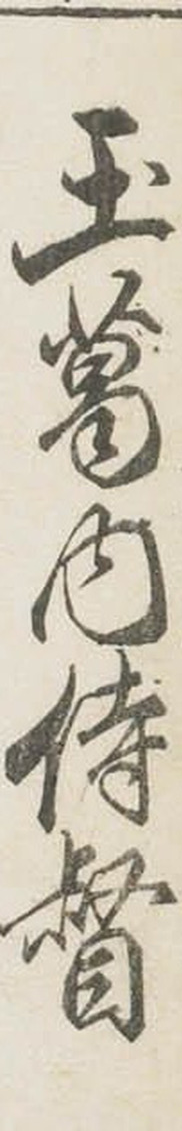玉葛内侍督
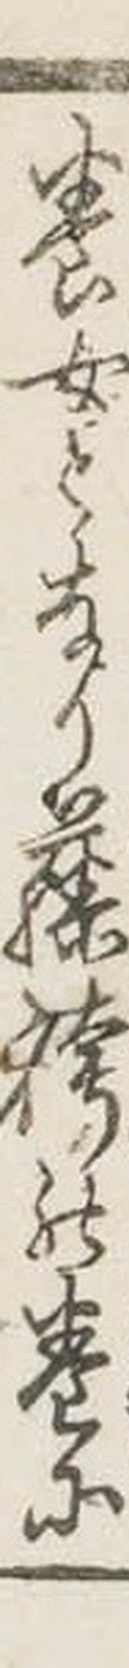養女となり藤袴の巻に
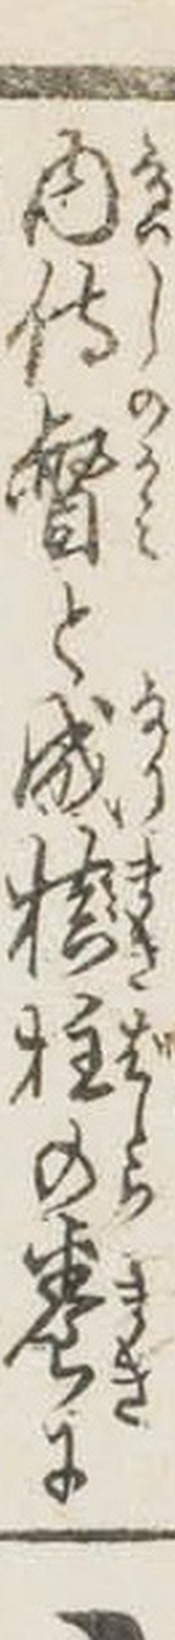内侍督と成槙柱の巻に
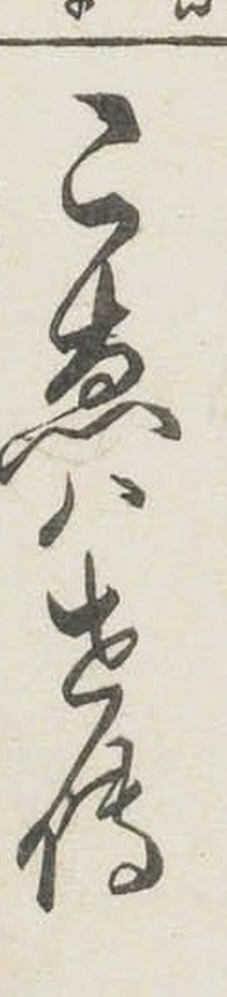こゑはせて
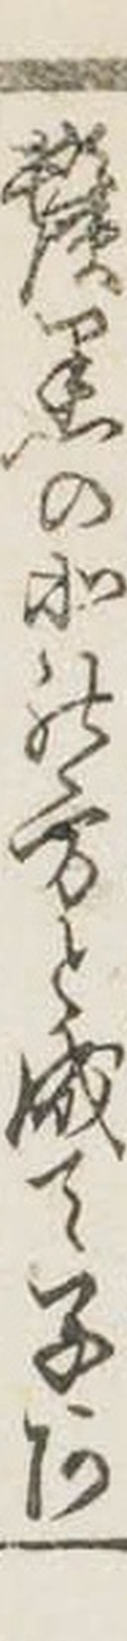鬚黒の北の方と成て子あ
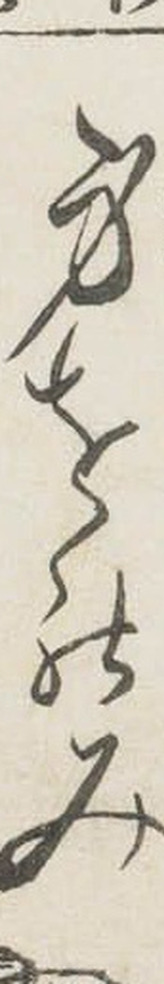身をのみ
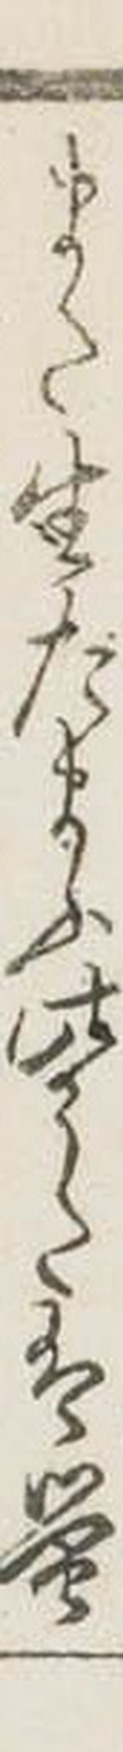また生たまふ此うたは蛍
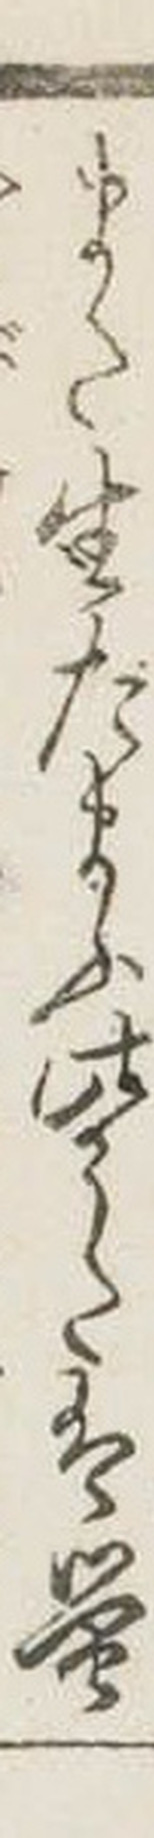また生たまふ此うたは蛍
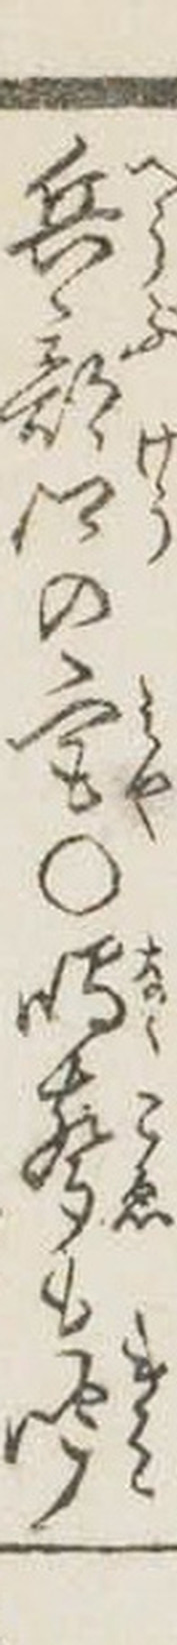兵部卿の宮○鳴声も聞
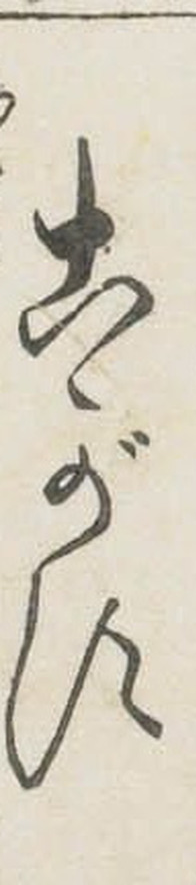こがす
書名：源氏百人一首
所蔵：東京学芸大学教育コンテンツアーカイブ
